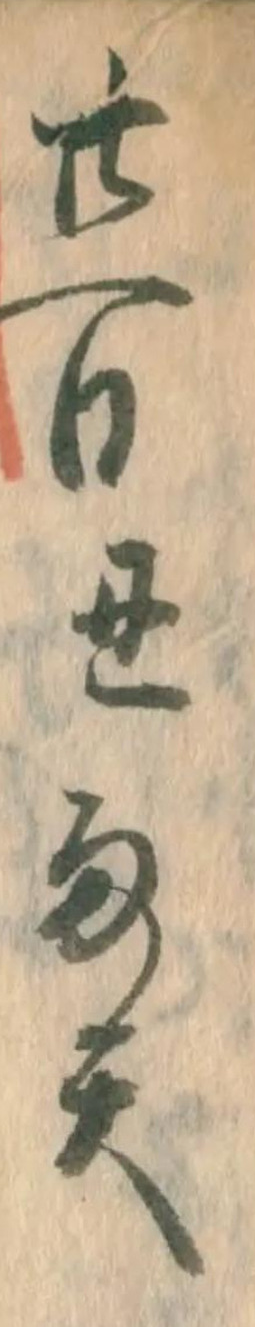廿一日丑雨天
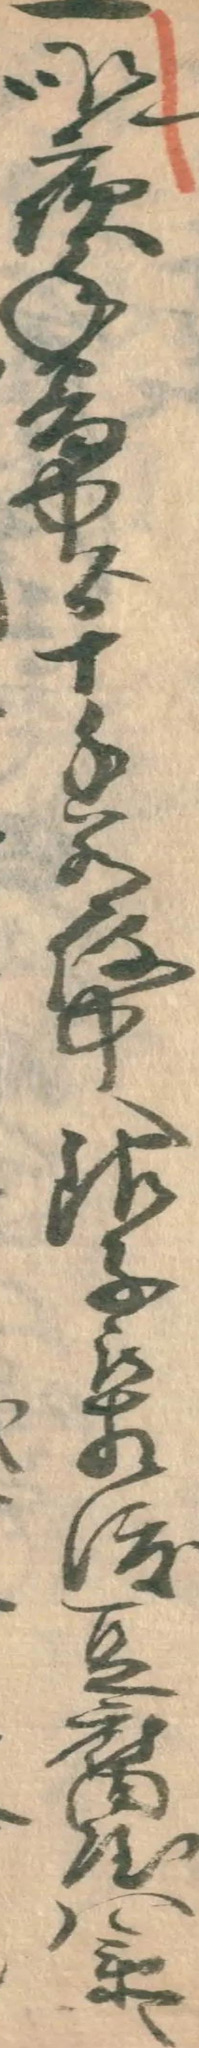一昨夜年番中ゟ十手若役中へ銀子被相渡豆腐屋八兵衛へ
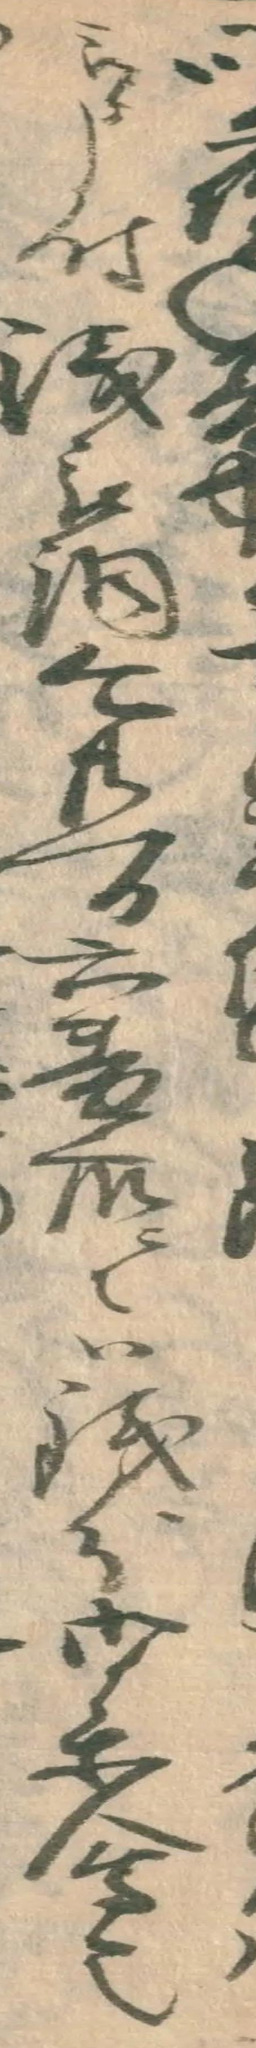被申付銭被調今廿一日六番衆ニてハ銭分御参会也
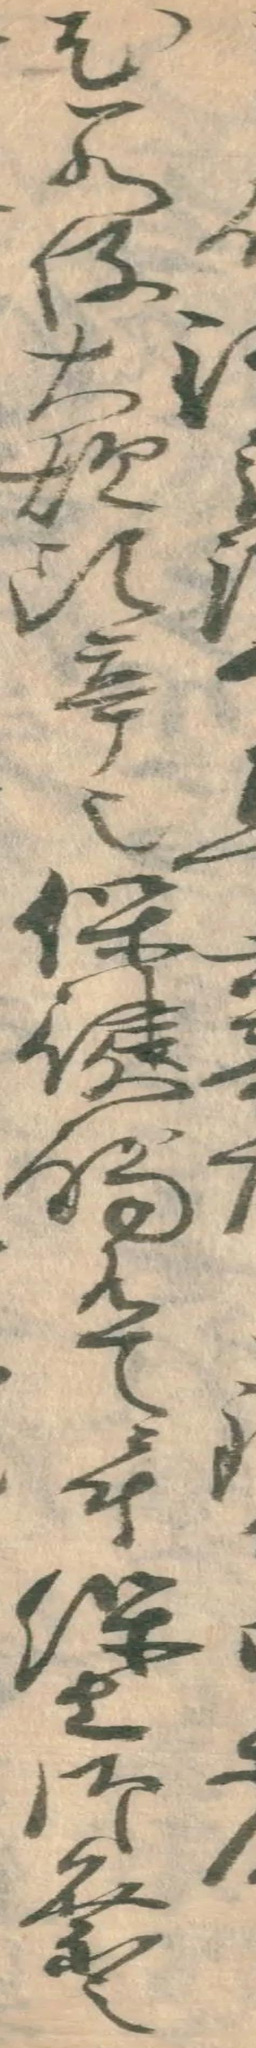尤若役大炊頭亭也保健触有之ニ付保土御祭之
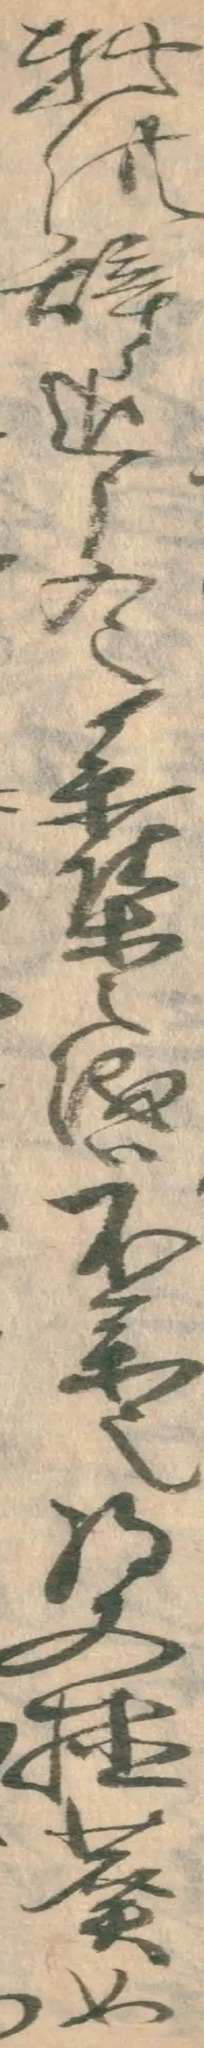転供辞退被申入也参集之儀ハ不参也将又植葵如
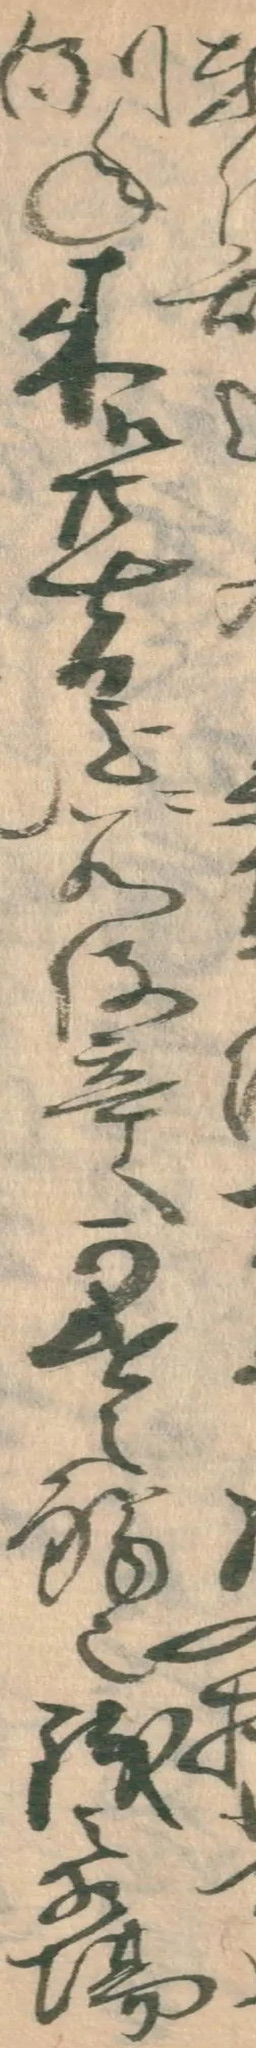例年来ル廿七日迄ニ若役亭へ可遣之触也銭之相場
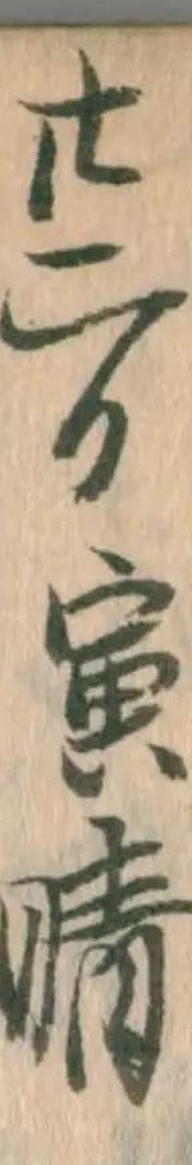廿二日寅晴
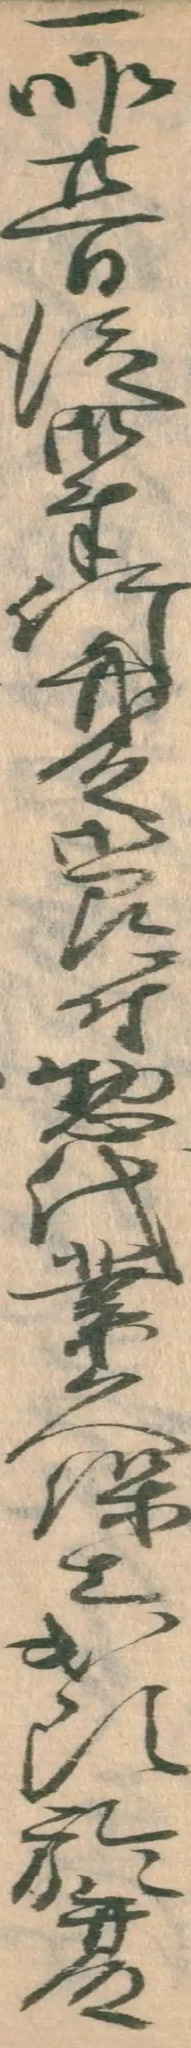一昨廿一日従御奉行弁殿御召ニ付惣代業久保土出頭於弁殿
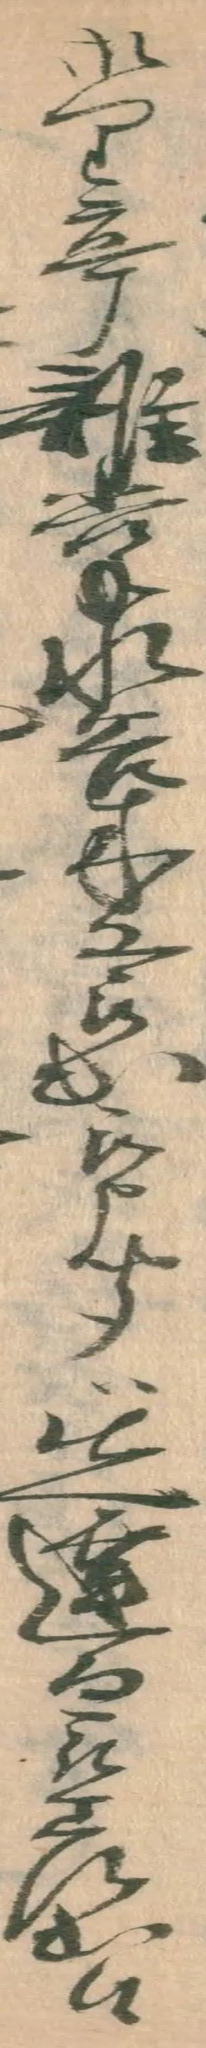御里亭雑掌水谷木工被出被申聞ハ先達而被差出候
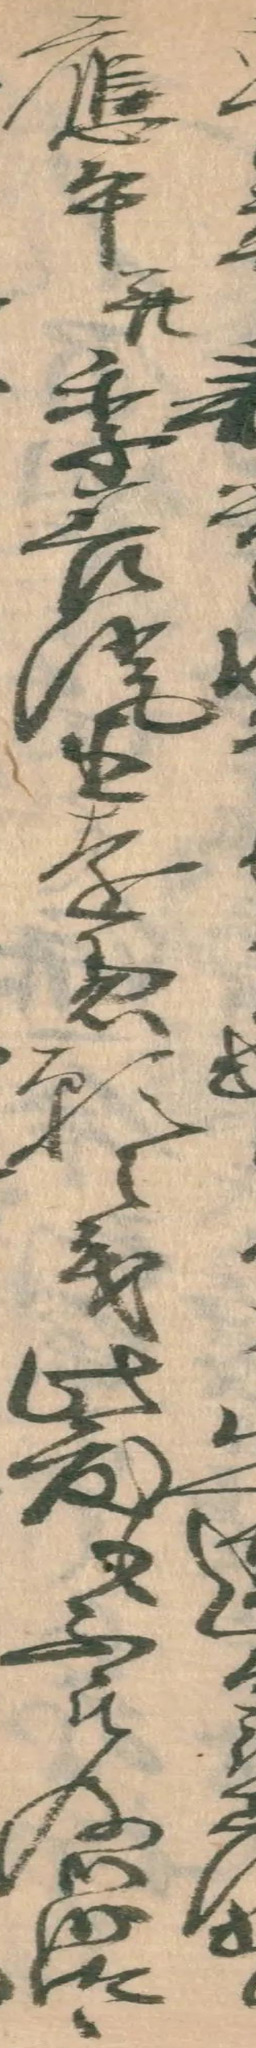応平并季善澄直遠慮願之義此度も不被及御沙汰候
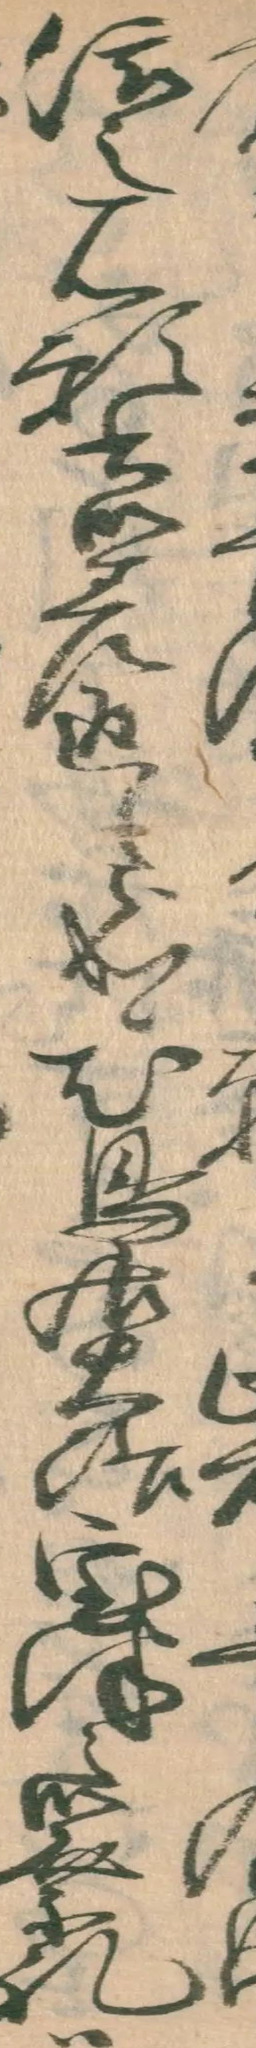依之右願書御差返し被成候尤鳥居大路宝津之御祭礼ハ
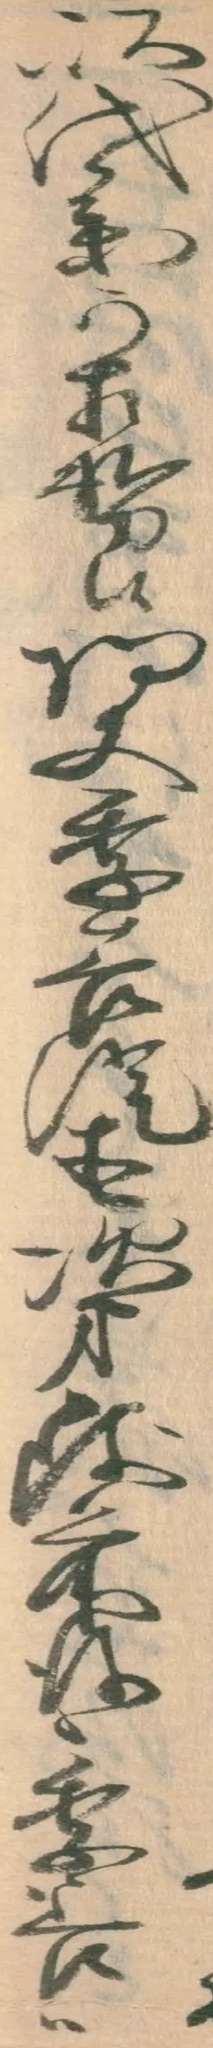以代参可相務候将又季善澄直次第致前後候季善ハ
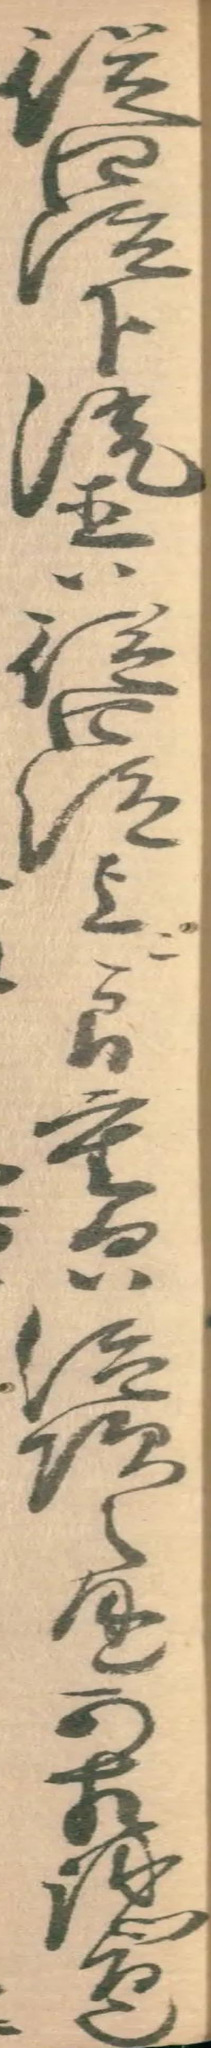従四位下澄直ハ従四位上ニ候間重而ハ位次之通可相認旨也
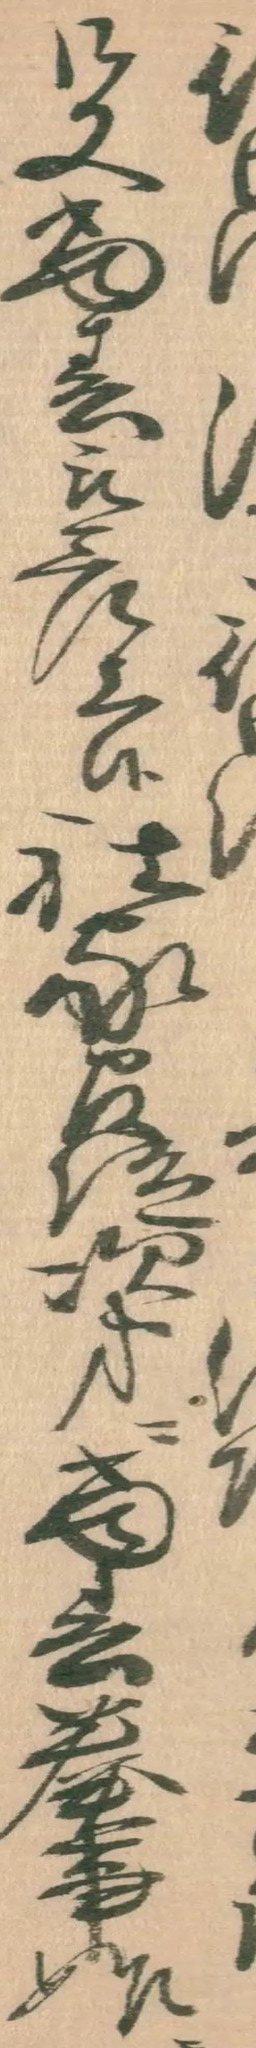且又当春被差上候社家官位次第ニ当春奏事始ニ
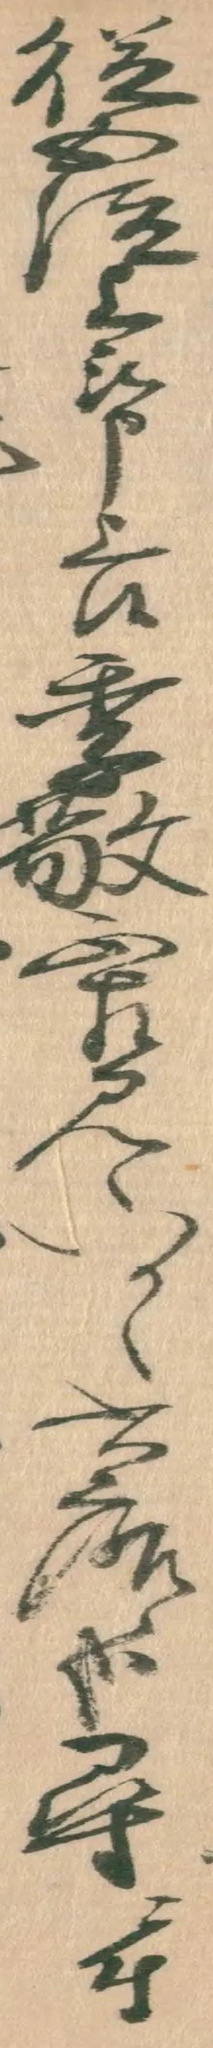従五位上被申上候季敬不相見候いかゝ書落候哉尋ニ付
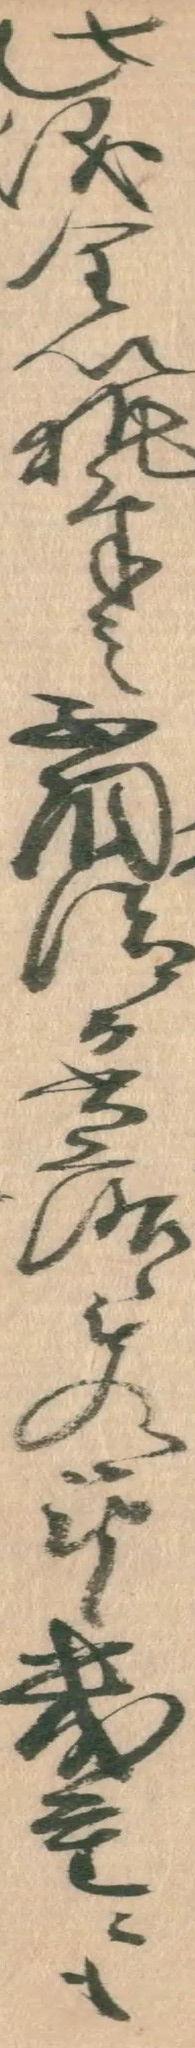此儀全以執筆之不調法ニ而書落候ものニ御座候幾重ニも
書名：賀茂社記録. 第60冊
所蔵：国立国会図書館 National Diet Library, JAPAN
